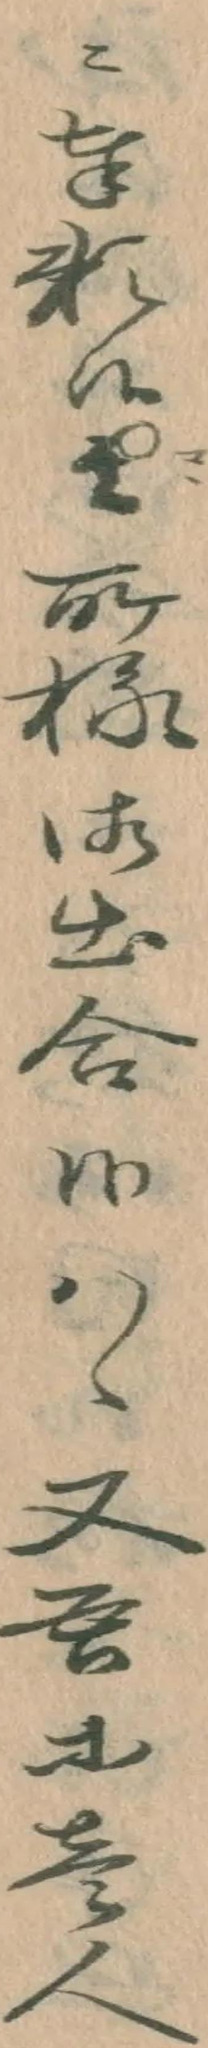に奉頼候其所様御出合候はゝ又吾等壱人
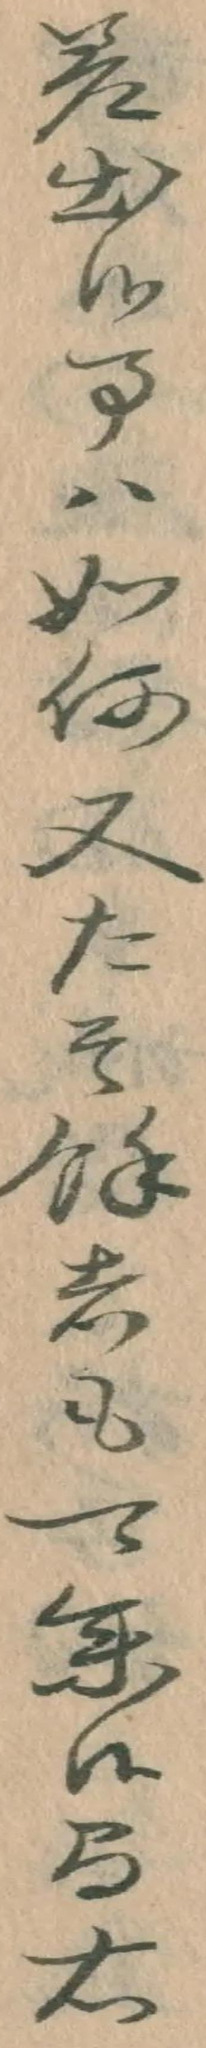差出候事は如何又たそ余者も可参候間右
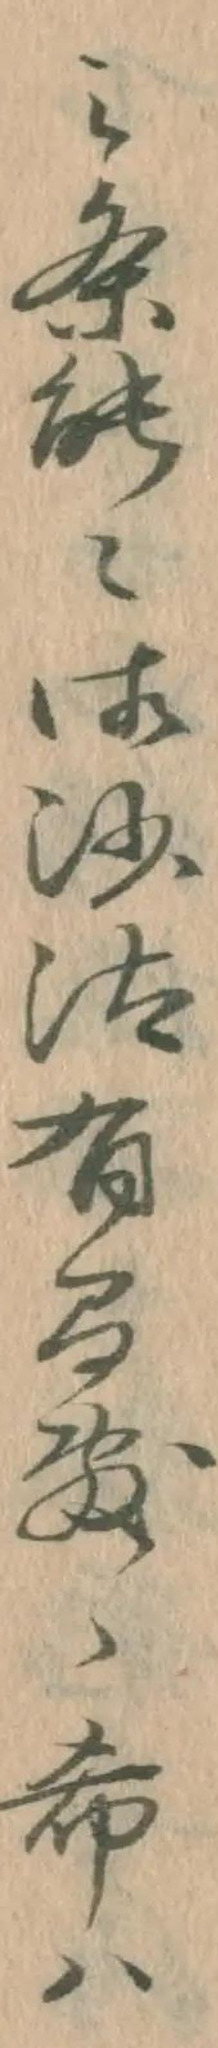之条能に御沙汰有間敷候希は
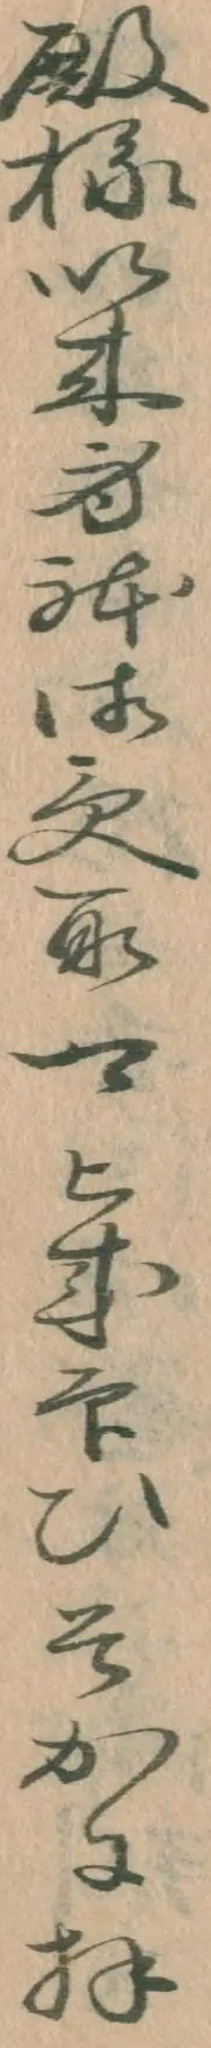殿様以来身躰御受取可被成印ひそか尓拝
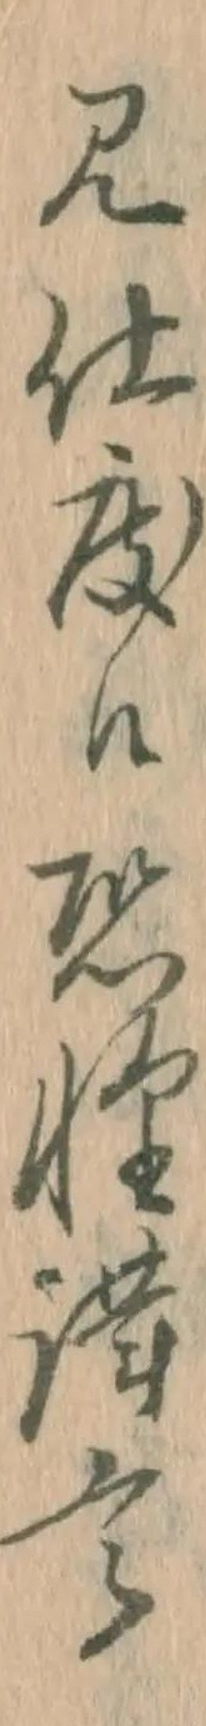見仕度候恐惶謹言
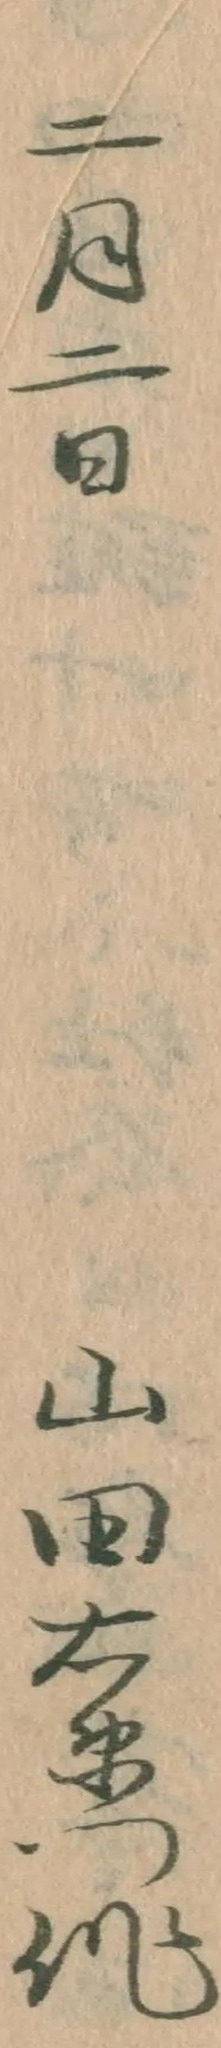二月二日山田右衛門作
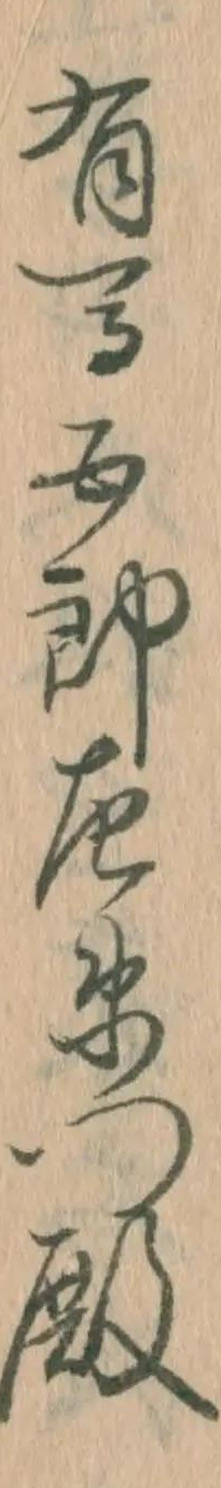有馬五郎左衛門殿
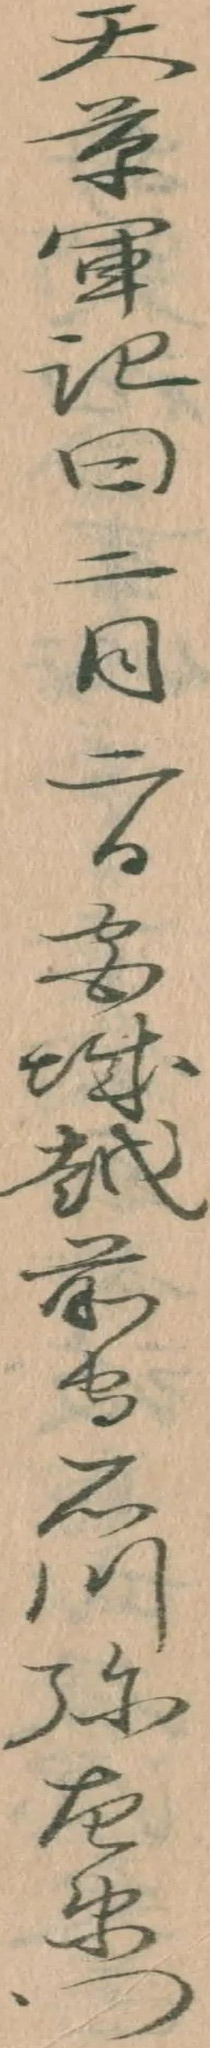天草軍記曰二月二日宮城越前守石川弥左衛門
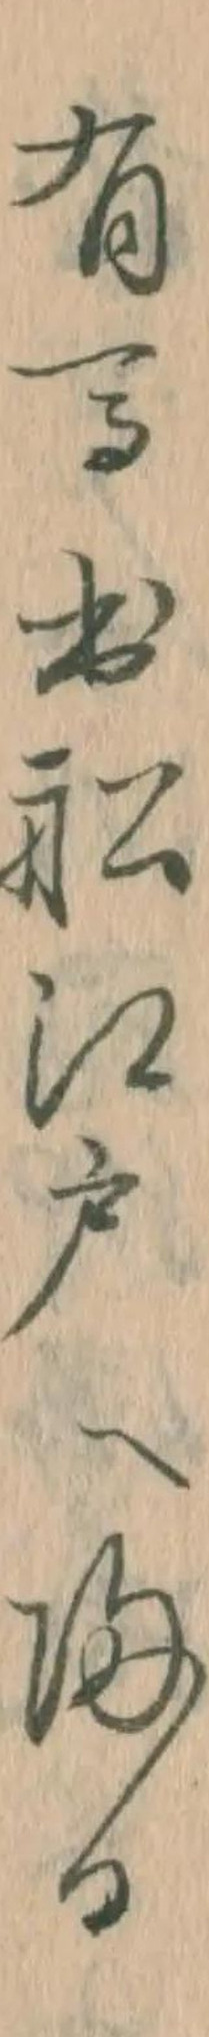有馬出舩江戸へ帰る
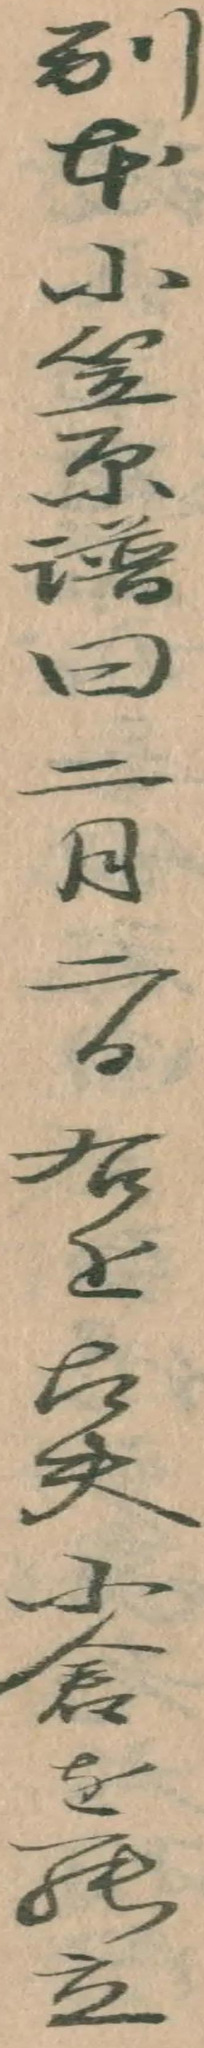別本小笠原譜曰二月二日右近太夫小倉を罷立
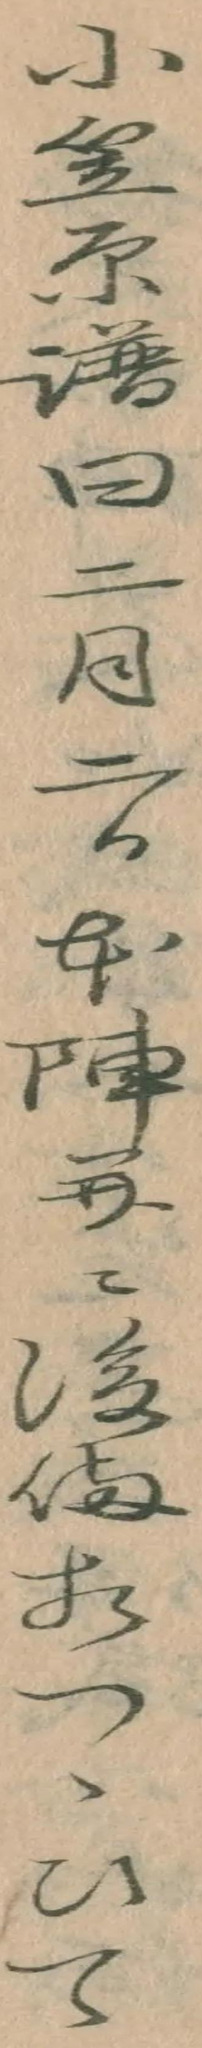小笠原譜曰二月二日本陣幷に後備相つゝひて
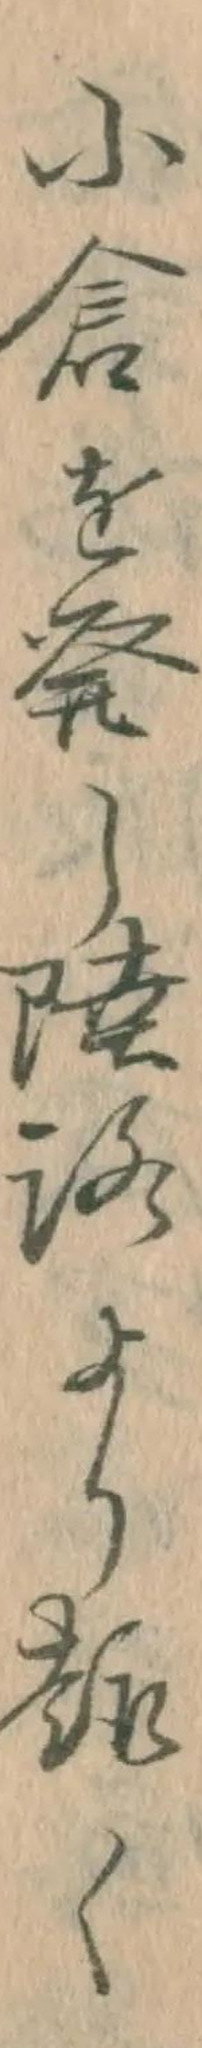小倉を発し陸路より趣く
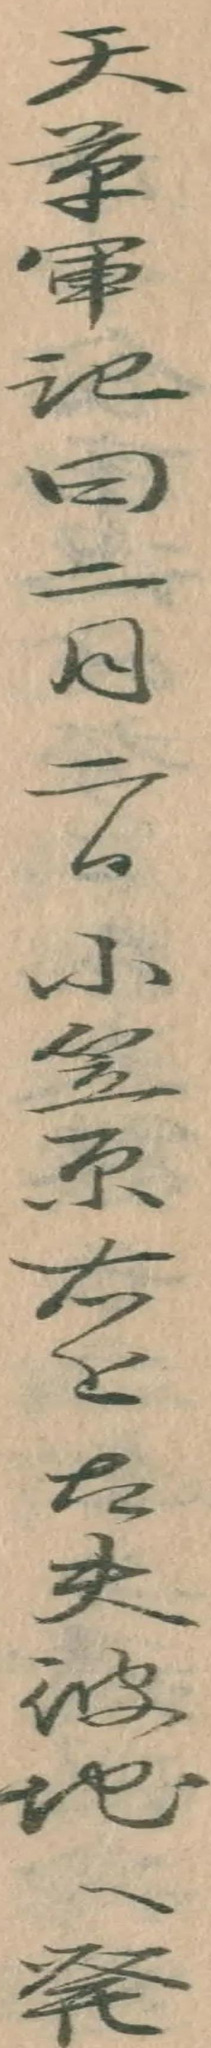天草軍記曰二月二日小笠原右近太夫彼地へ発
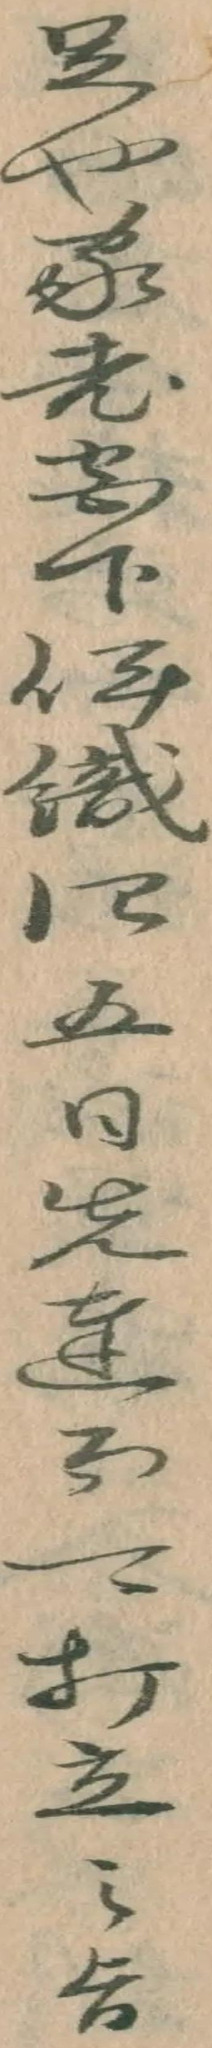足や家老宮下伊織四五日先達而可打立之旨
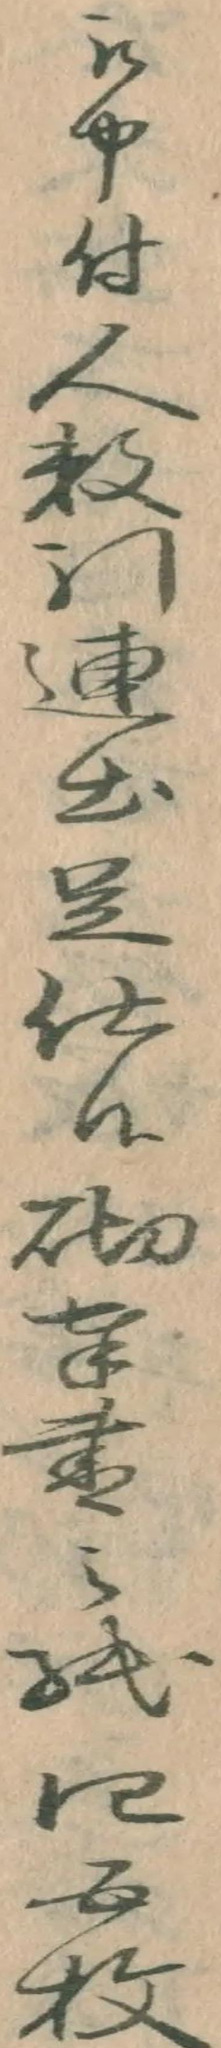被申付人数引連出足仕候砌奉書之残四五枚
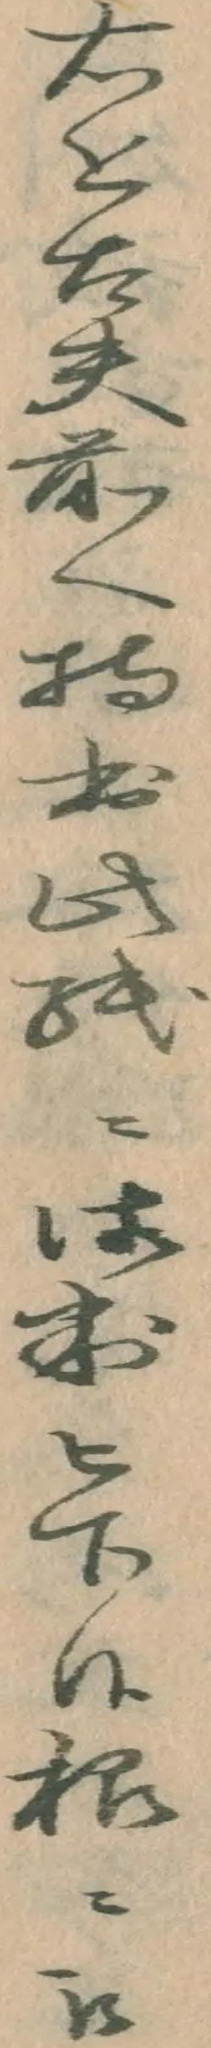右近太夫前へ持出此残に御成被下候様に被
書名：切支丹御退治記 49巻. [6]
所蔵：国立国会図書館 National Diet Library, JAPAN
